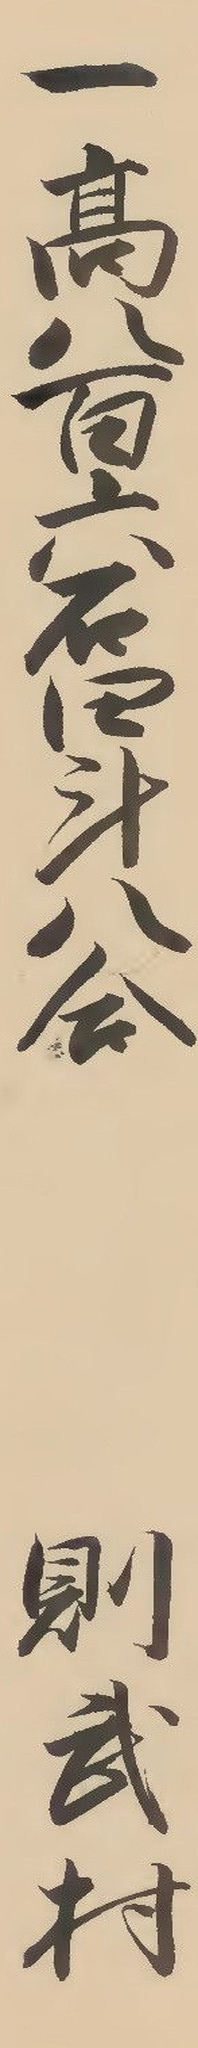一高八百六石四斗八合則武村
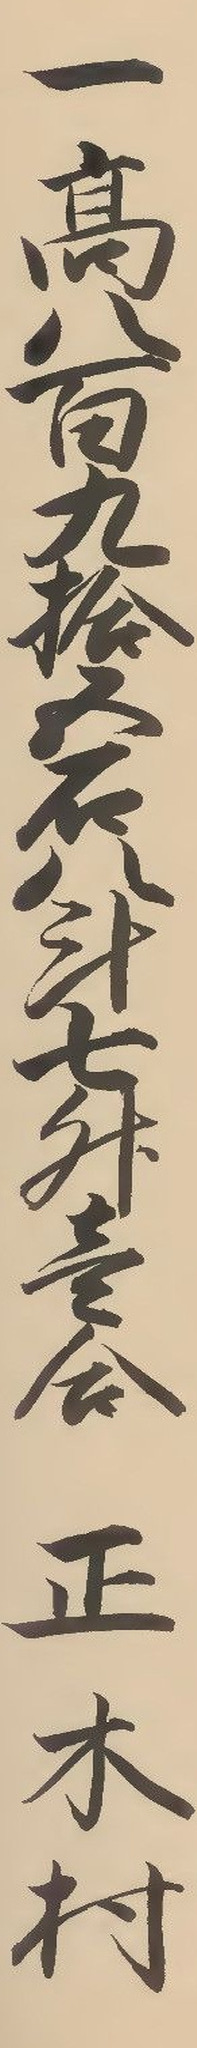一高八百九拾五石八斗七升壱合正木村
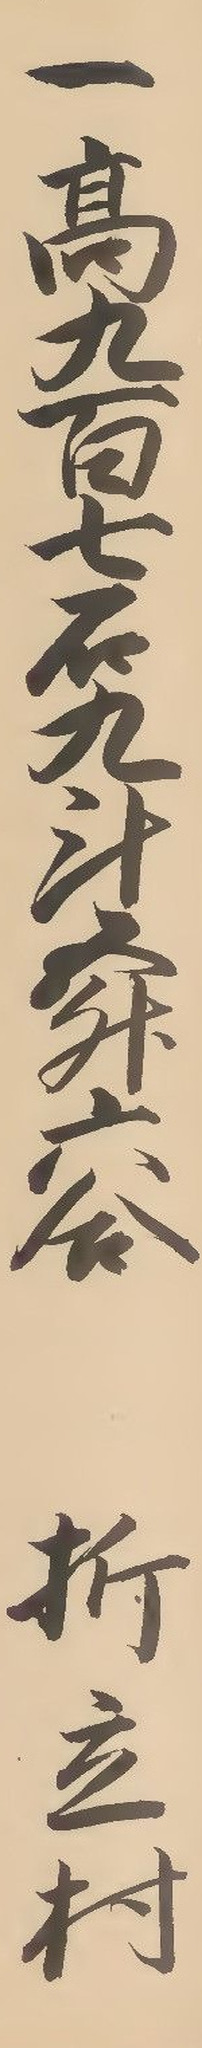一高九百七石九斗五升六合折立村
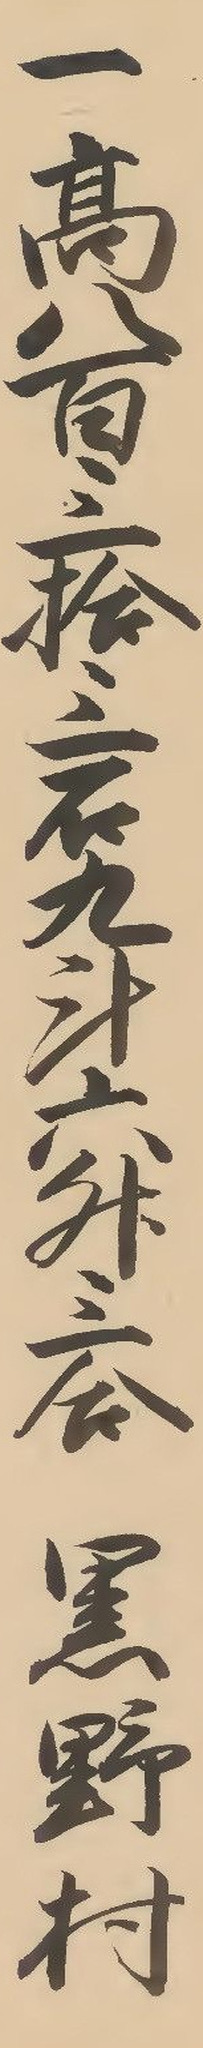一高八百三拾三石九斗六升三合黒野村
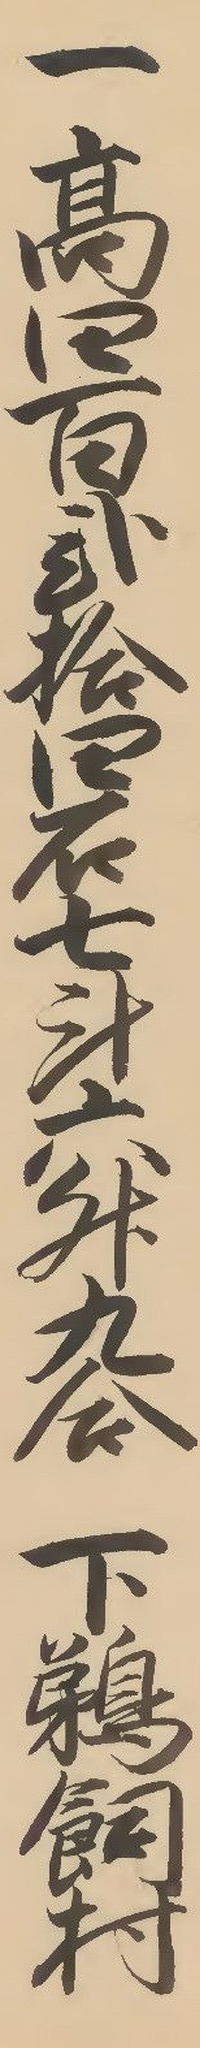一高四百弐拾四石七斗六升九合下鵜飼村
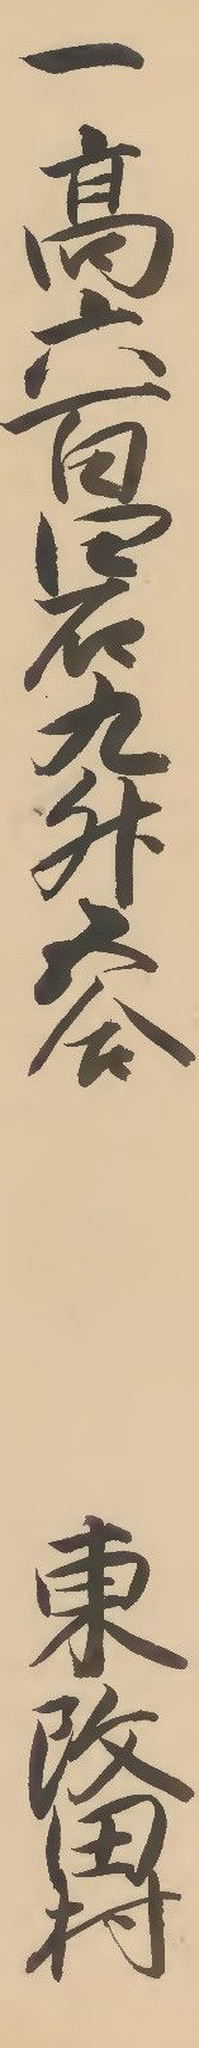一高六百四石九升五合東改田村

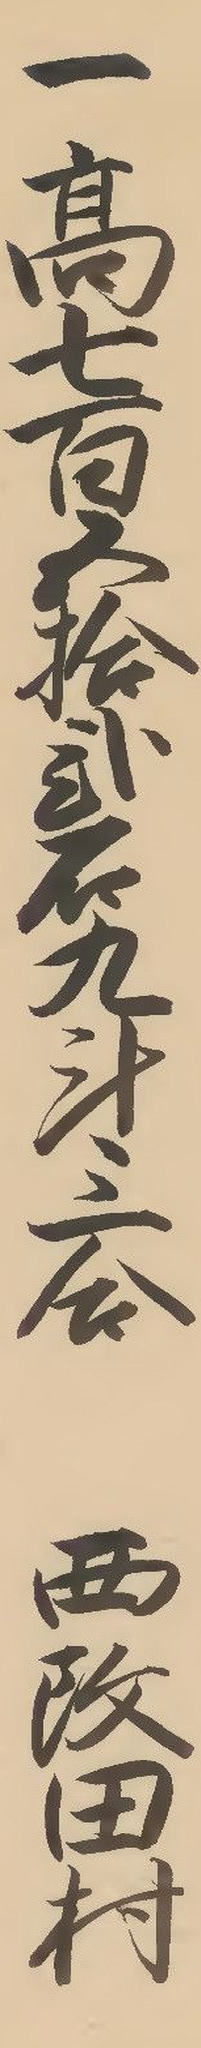一高七百五拾弐石九斗三合西改田村
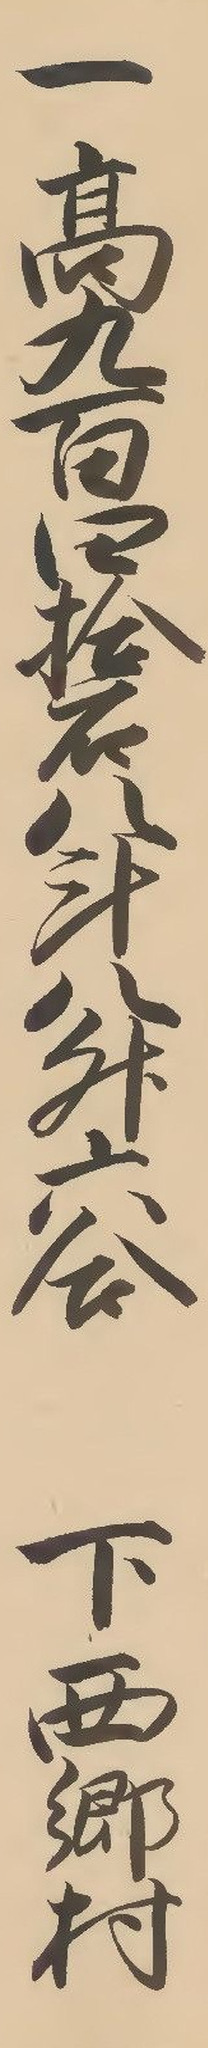一高九百四拾石八斗八升六合下西郷村
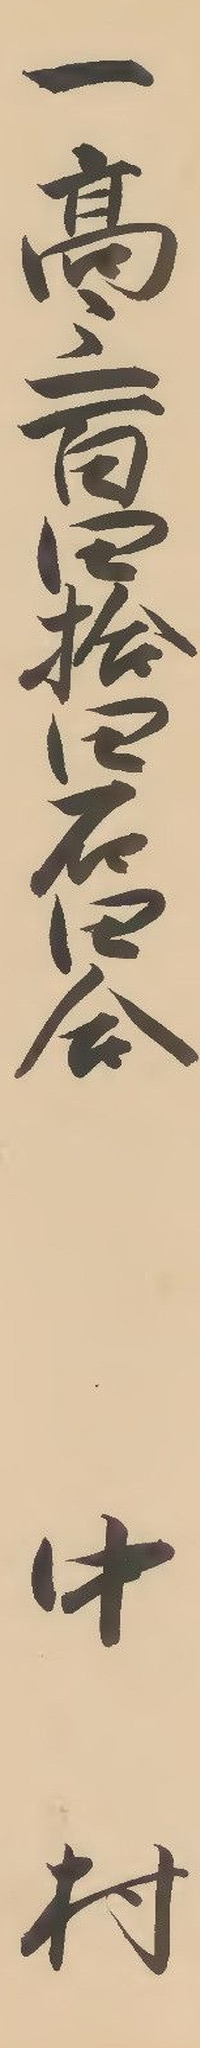一高三百四拾四石四合中村
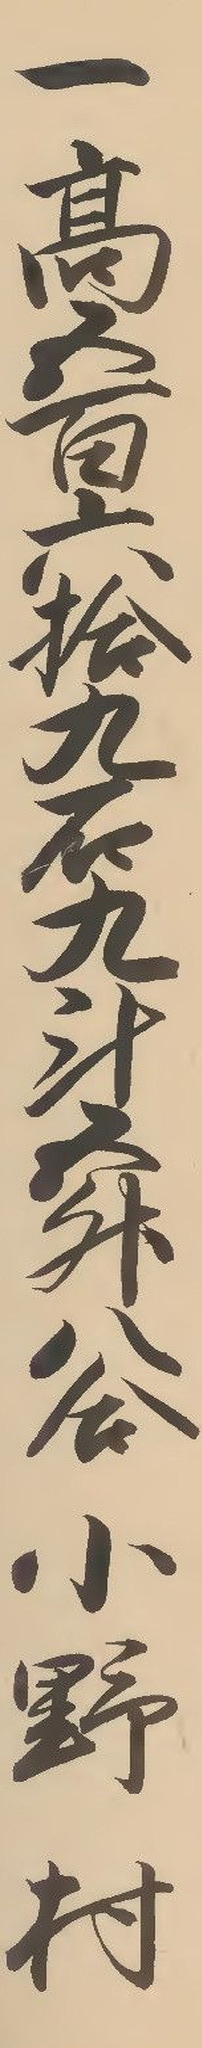一高五百六拾九石九斗五升八合小野村
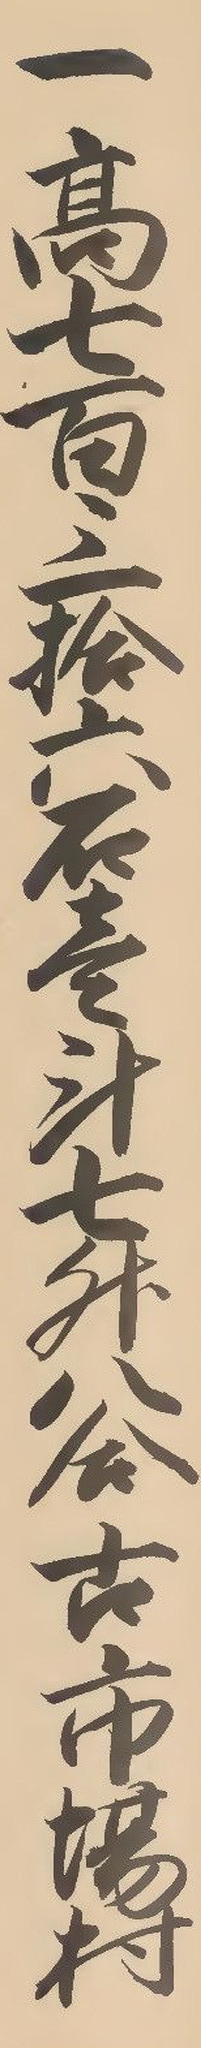一高七百三拾六石壱斗七升八合古市場村
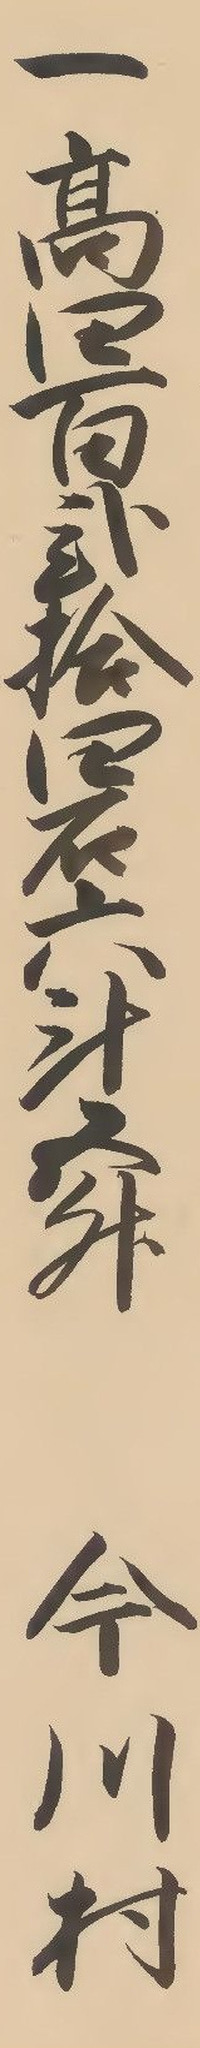一高四百弐拾四石六斗五升今川村
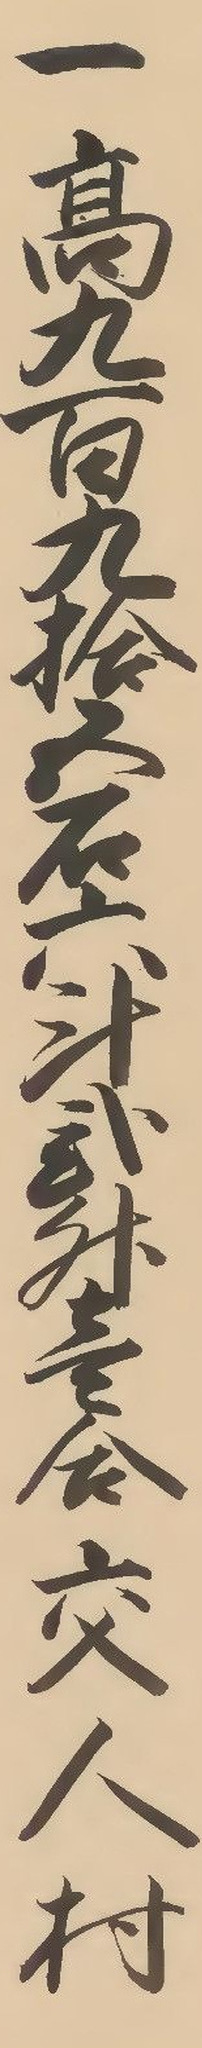一高九百九拾五石六斗弐升壱合交人村
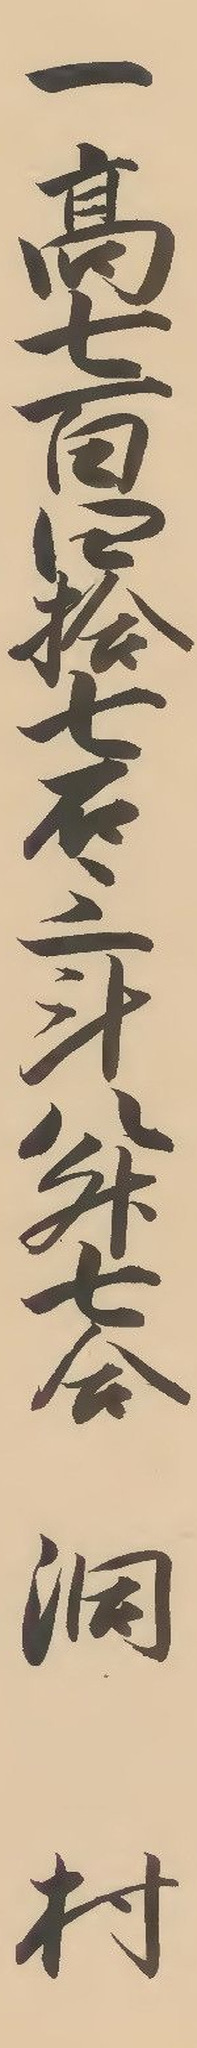一高七百四拾七石三斗八升七合洞村

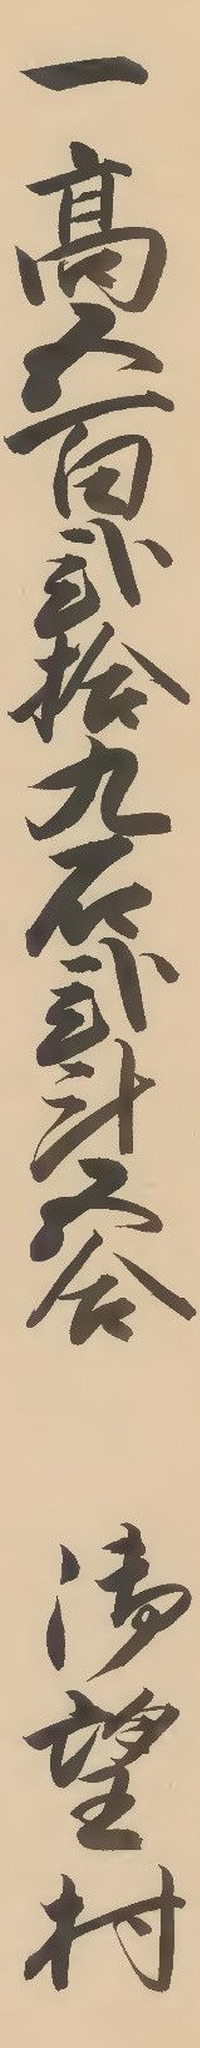一高五百弐拾九石弐斗五合御望村
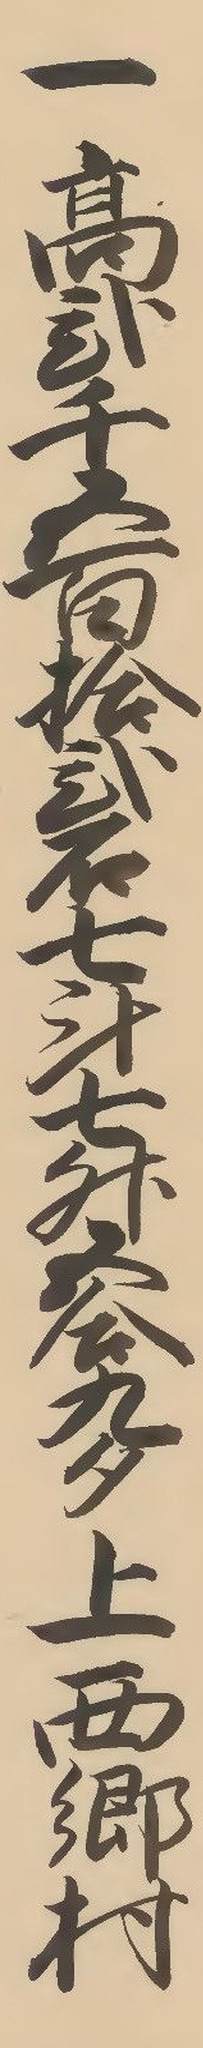一高弐千五百拾弐石七斗七升五分九勺上西郷村
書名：美濃国郷帳
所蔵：国立公文書館 National Archives of Japan
